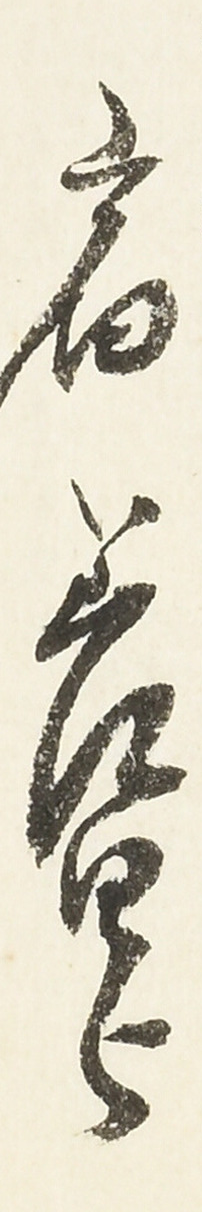宿善四郎
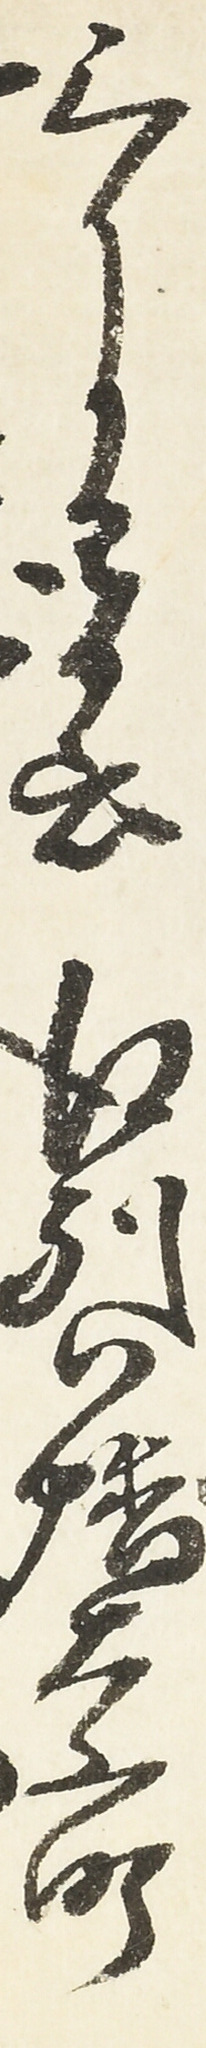三月四日着江州八幡大工町
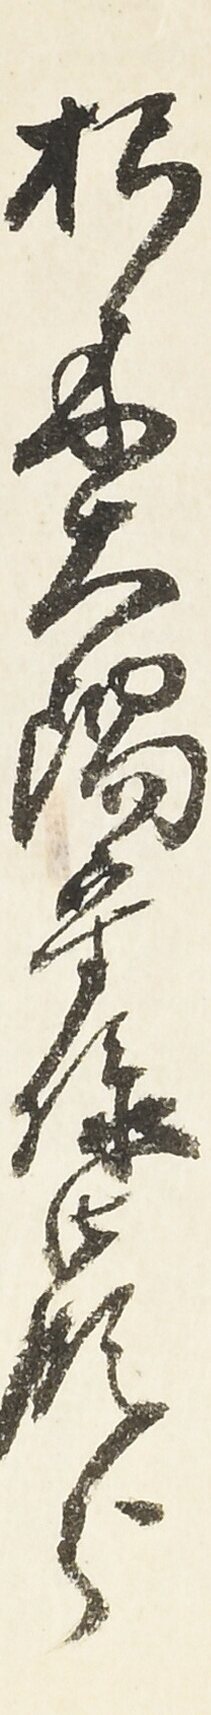朽木大隅守様御領分
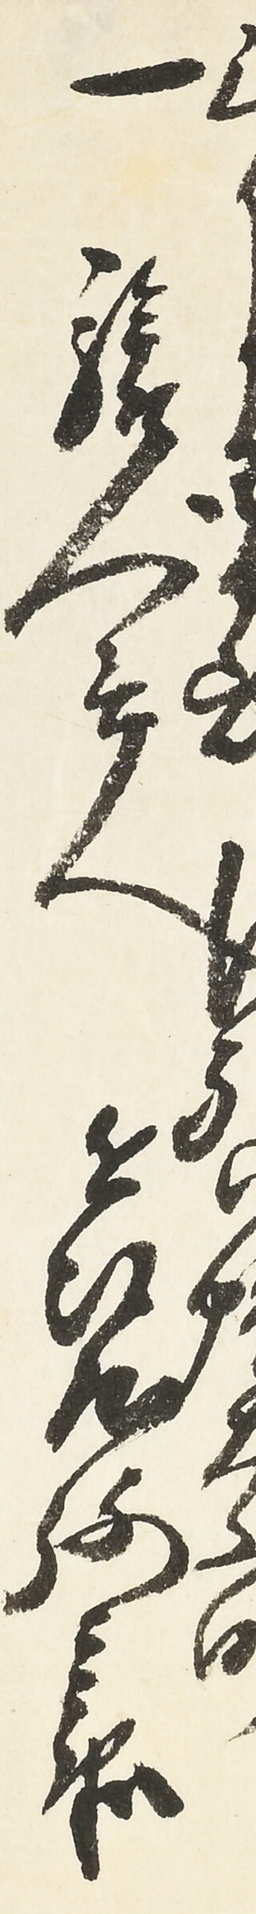一旅人壱人近江屋弥兵衛
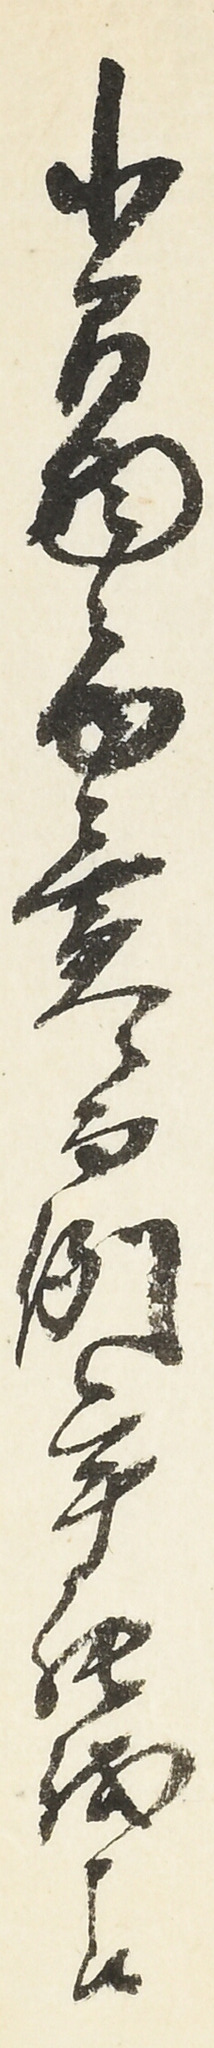小間物商売ニ而例年罷越申候
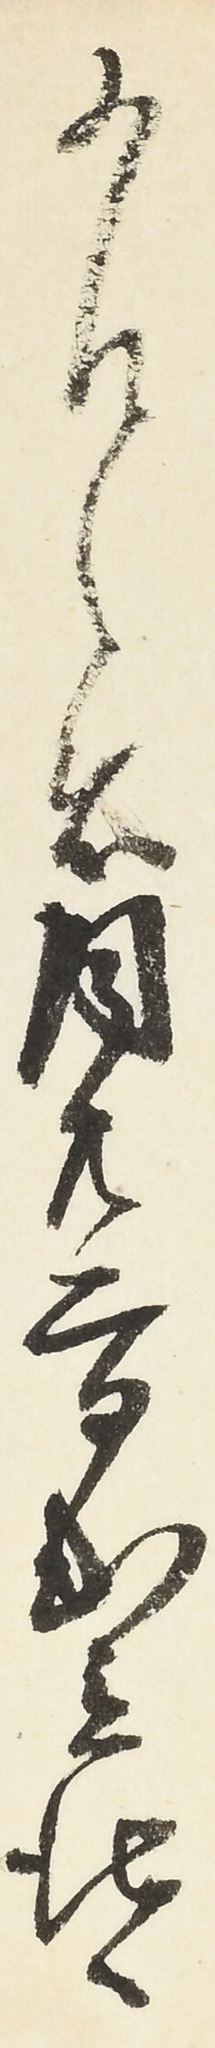右之者同廿二日出立仕候

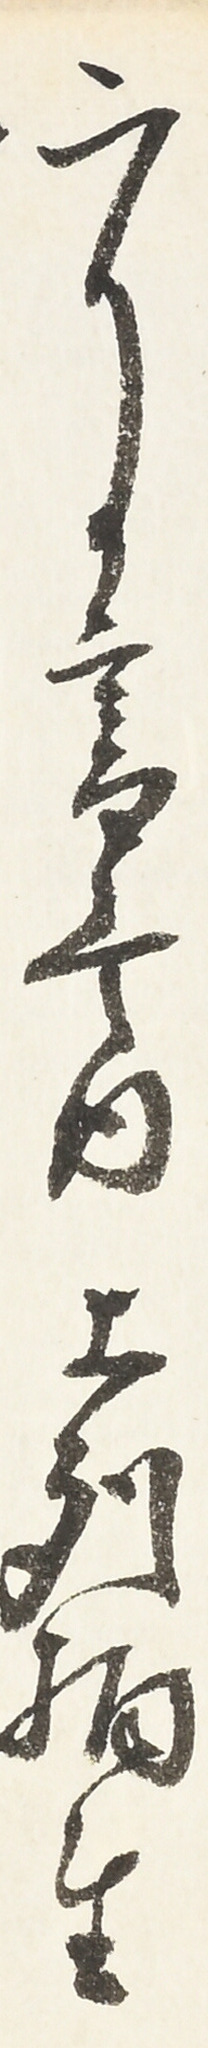二月書上之内上州桐生
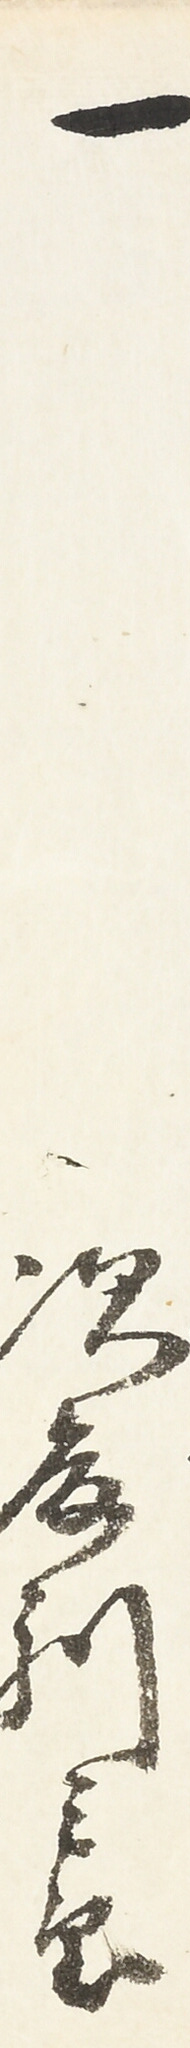一次藤利兵衛
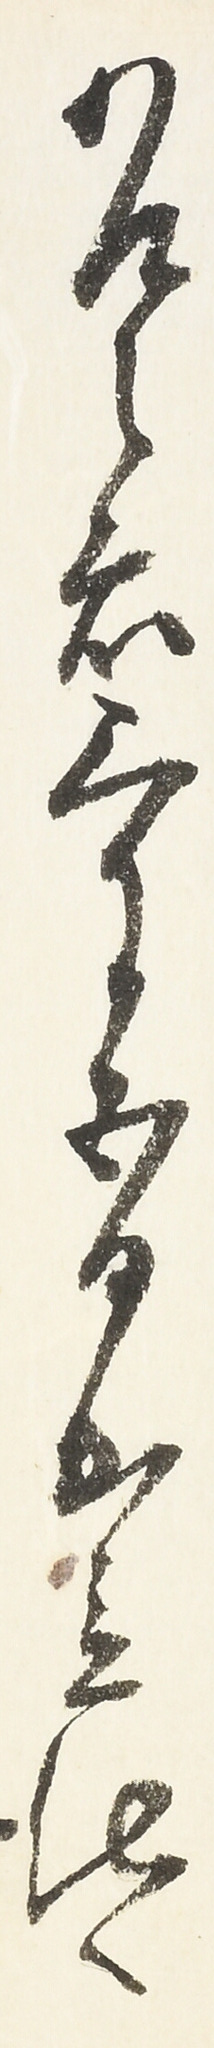右之者三月五日出立仕候
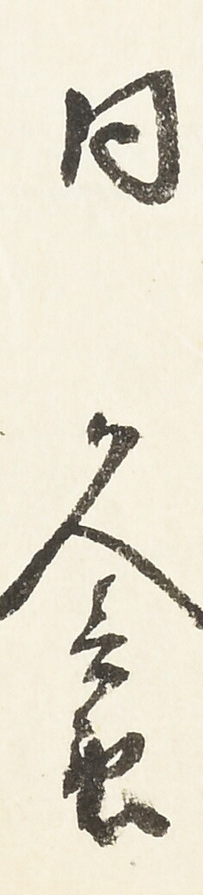同久兵衛
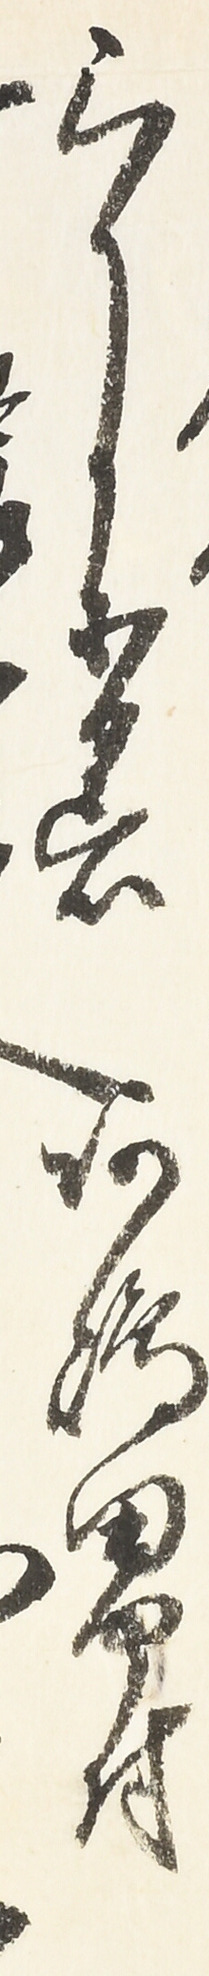三月五日着阿嶋田中村
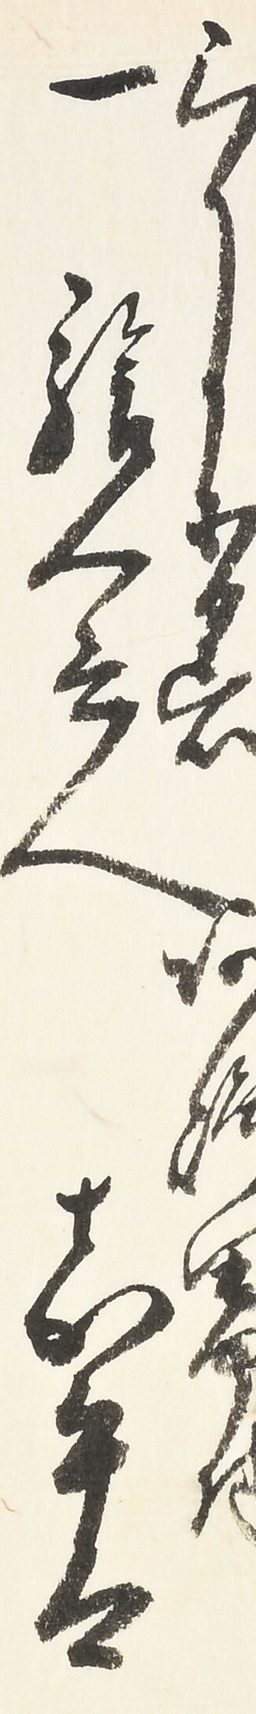一旅人壱人嘉平太
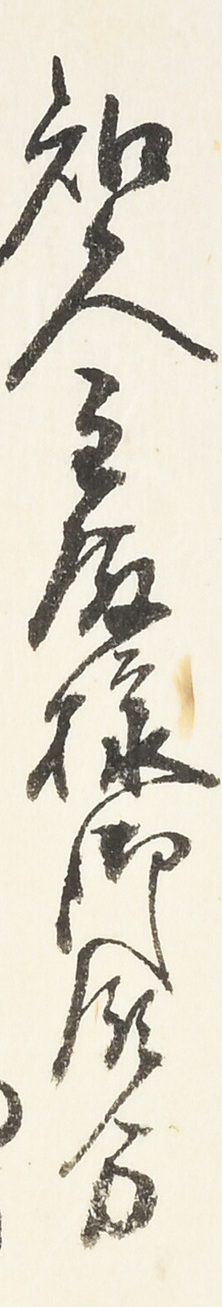知久主殿様御領分
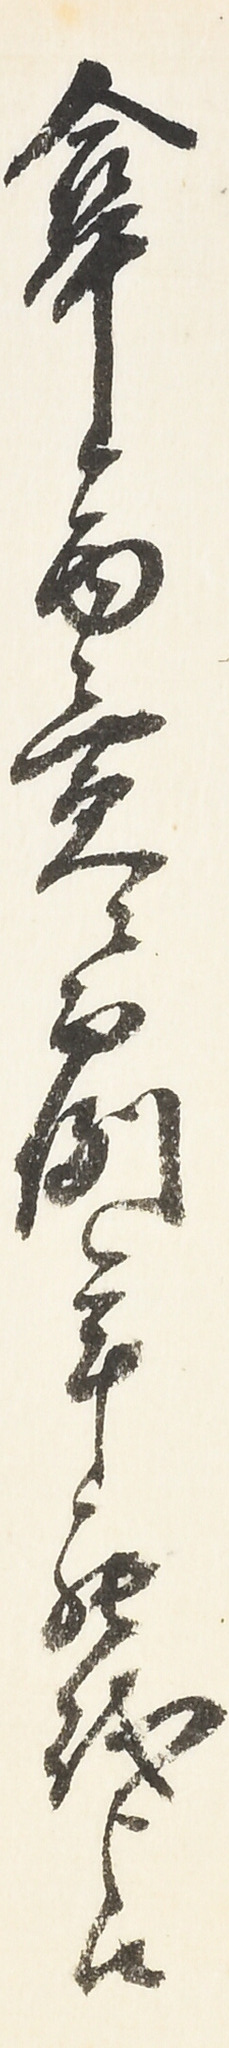傘商売ニ而例年罷越申候
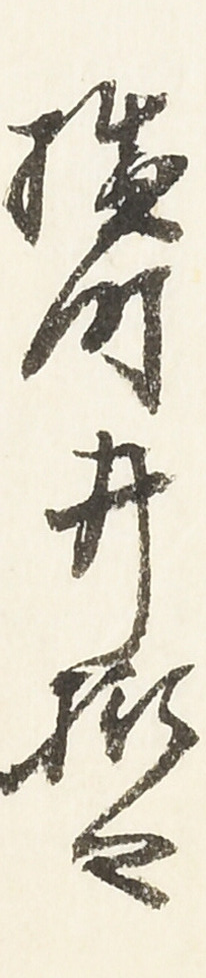横町井桁屋
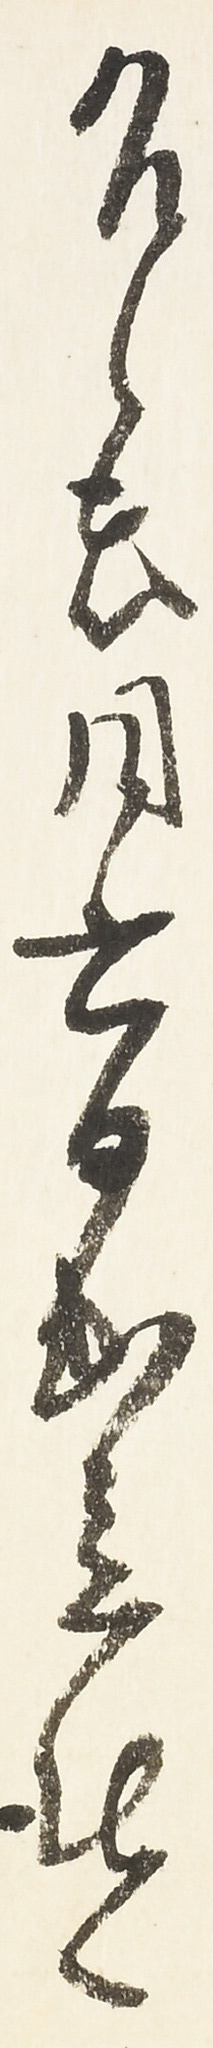右之者同六日出立仕候
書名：町中旅人泊控帳
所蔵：伊那市立高遠町図書館・合同会社AMANE
